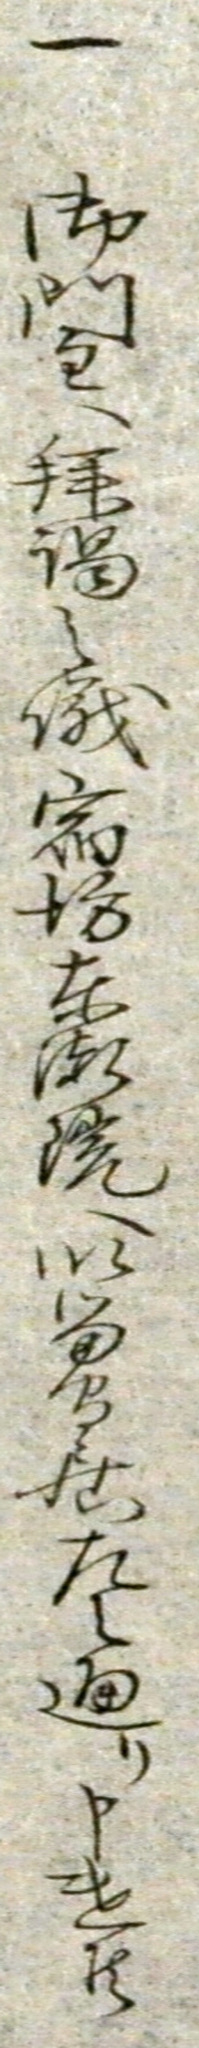一御門主へ拝謁之儀宿坊東漸院へ以留守居左之通り申遣候
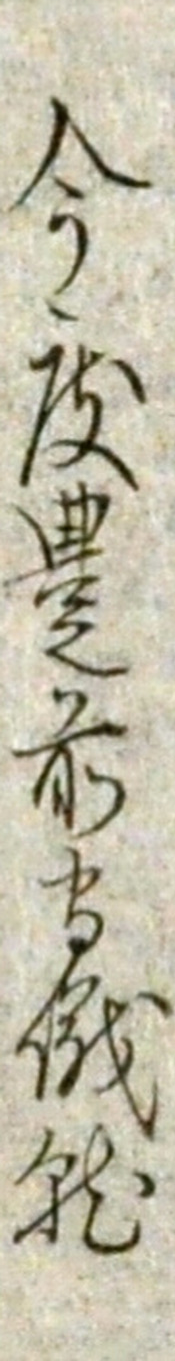今度豊前守儀就
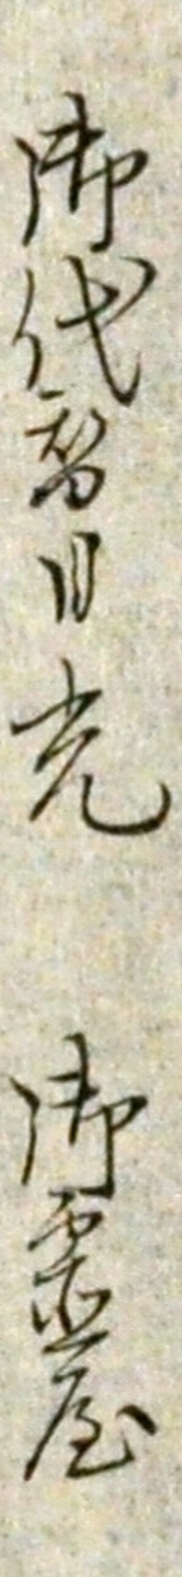御代替日光御霊屋
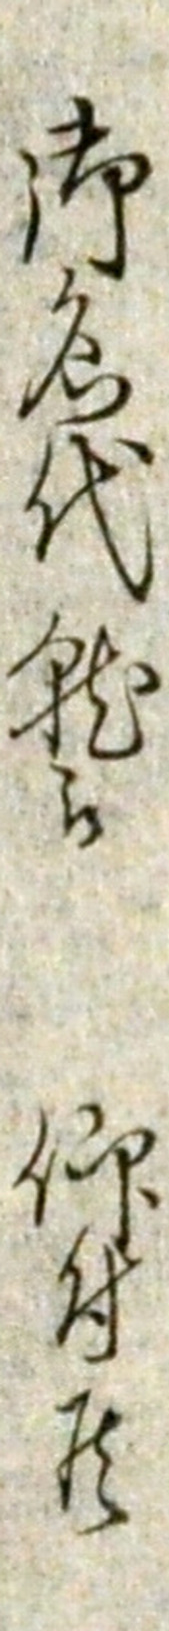御名代就被仰付候
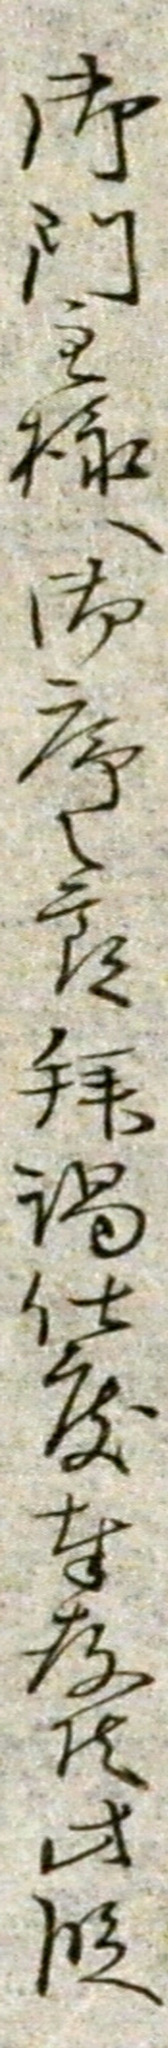御門主様へ御席之節拝謁仕度奉存候此段
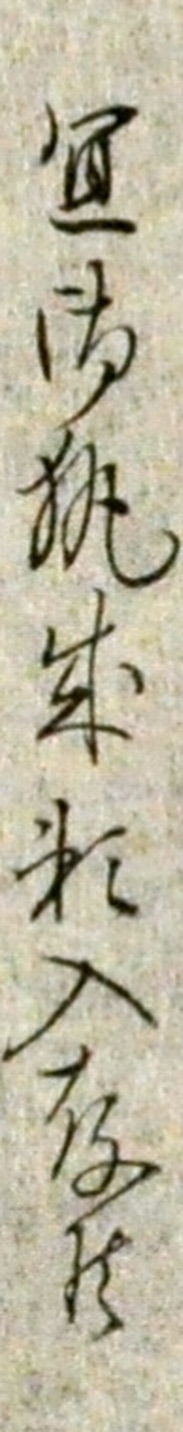宜御執成頼入存候
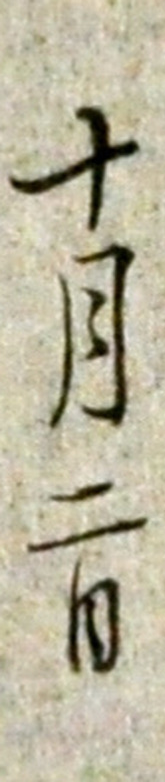十月二日
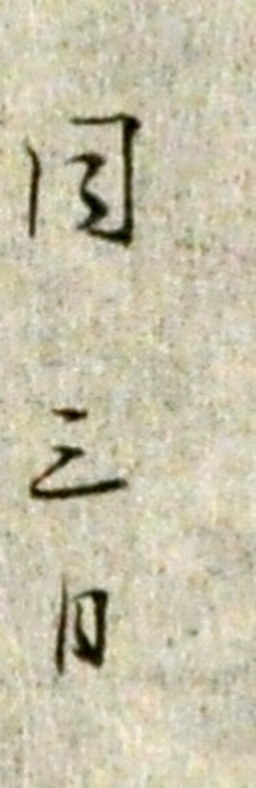同三日
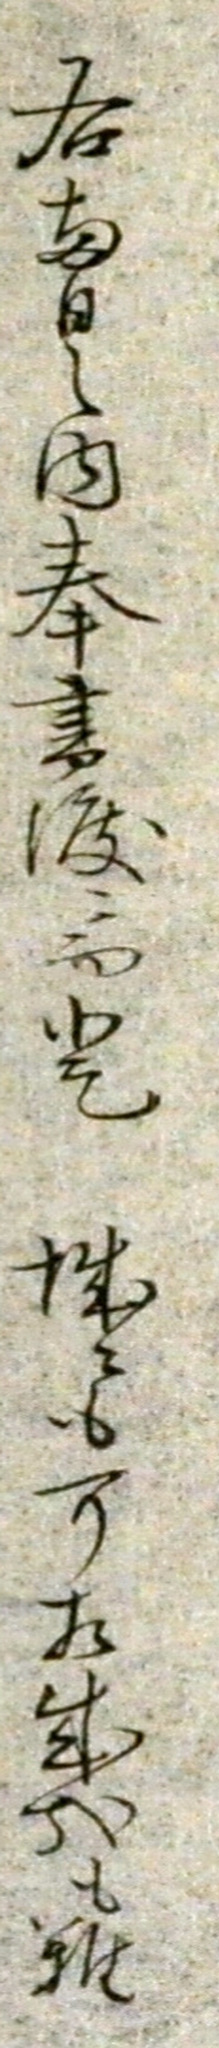右両日之内奉書渡ニ而登城ニも可相成哉も難
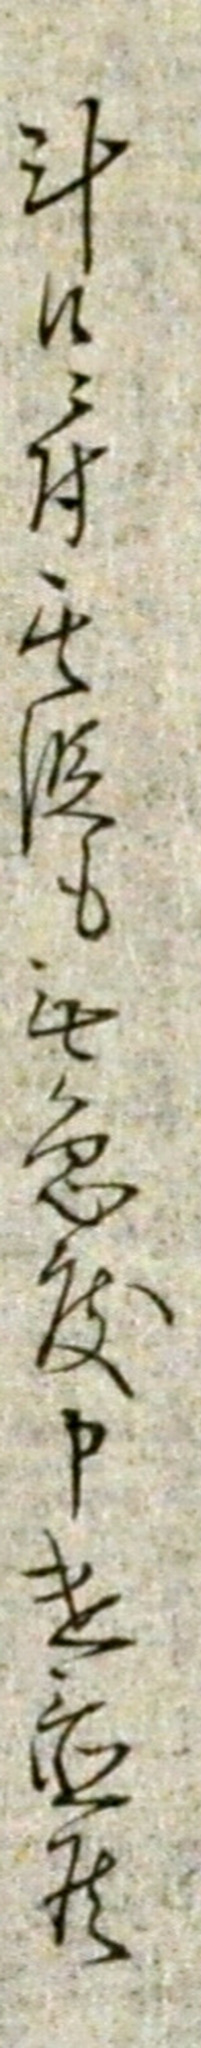計候ニ付其段も無急度申遣置候
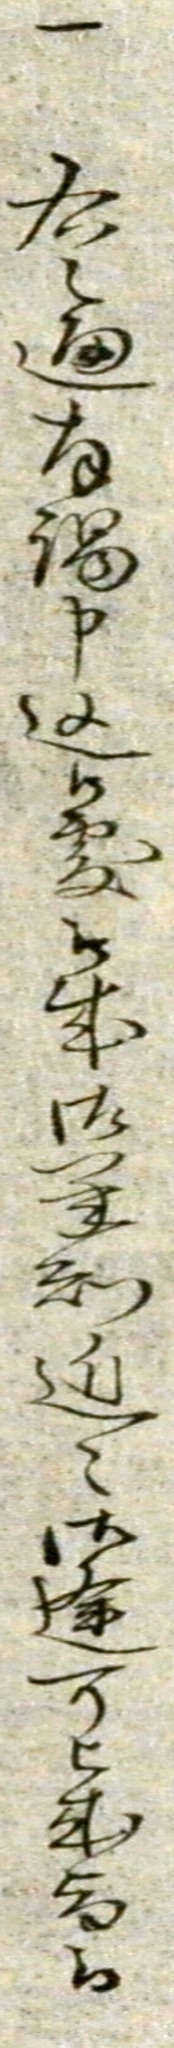一右之通拝謁申込候處被成御承知近々御逢可被成旨被
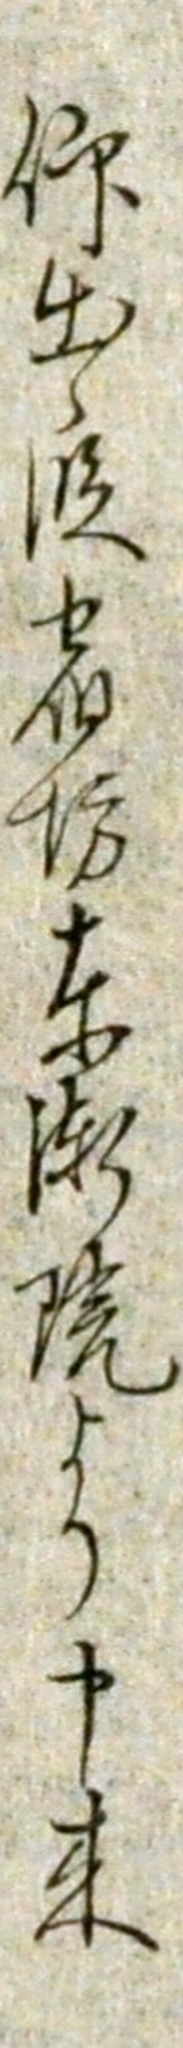仰出候段宿坊東漸院より申来
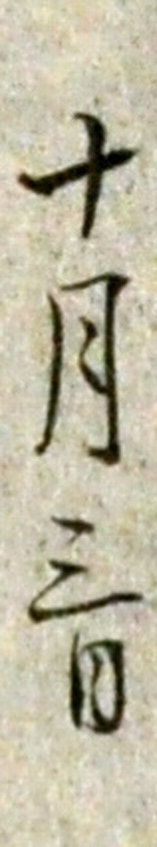十月三日
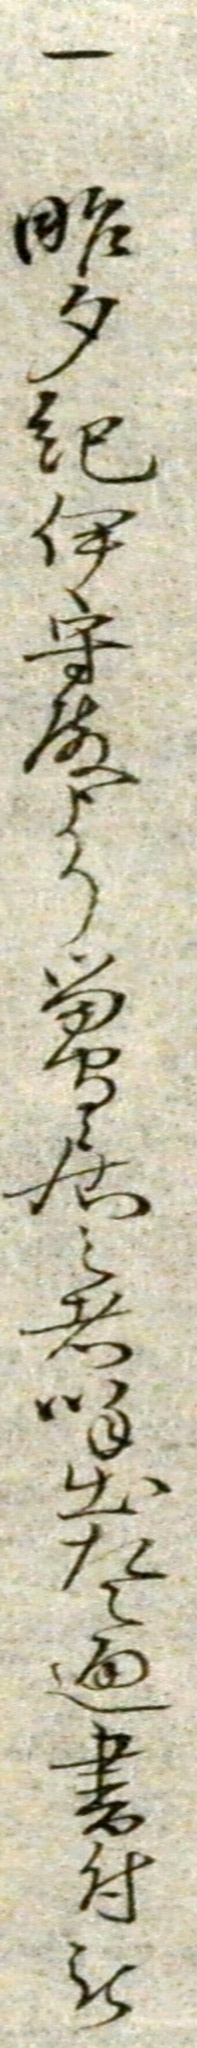一昨夕紀伊守殿より留守居之者呼出左之通書付被
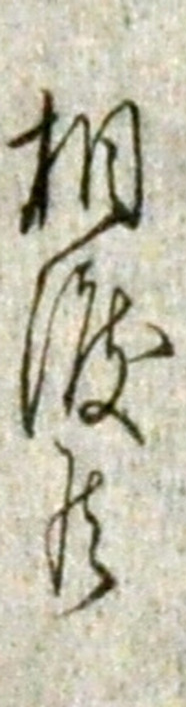相渡候

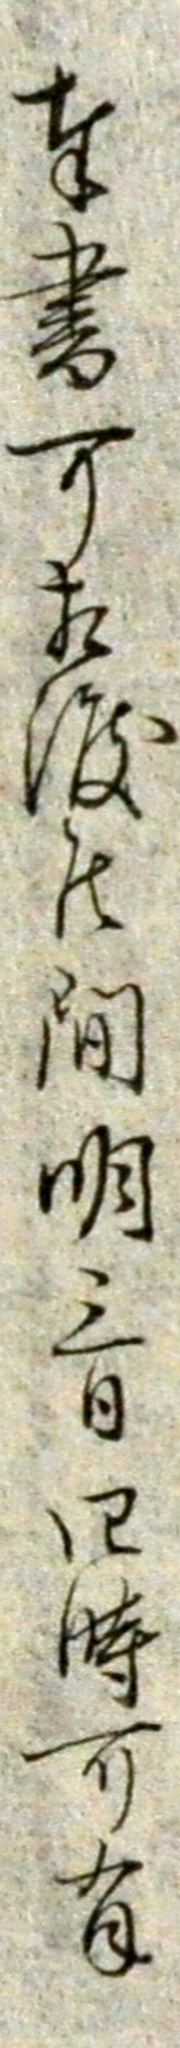奉書可相渡候間明三日四時可有
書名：日光御名代相勤候節ノ留
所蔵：伊那市立高遠町図書館・合同会社AMANE
